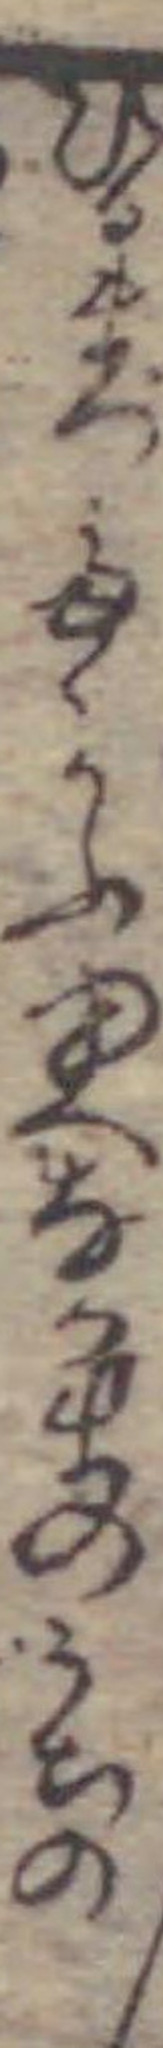ひるまづたゝかふゆへなかまのうちの
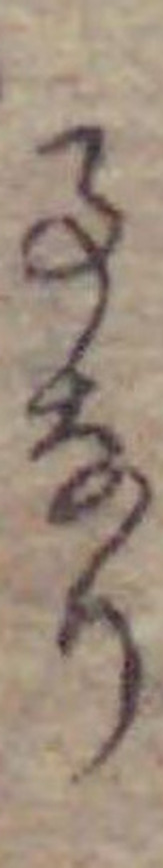事なり
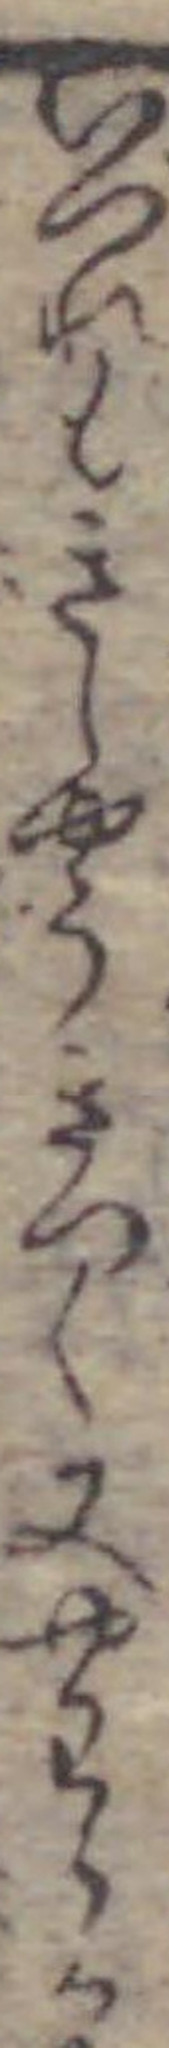いづれもきしやうきつく又やわらか
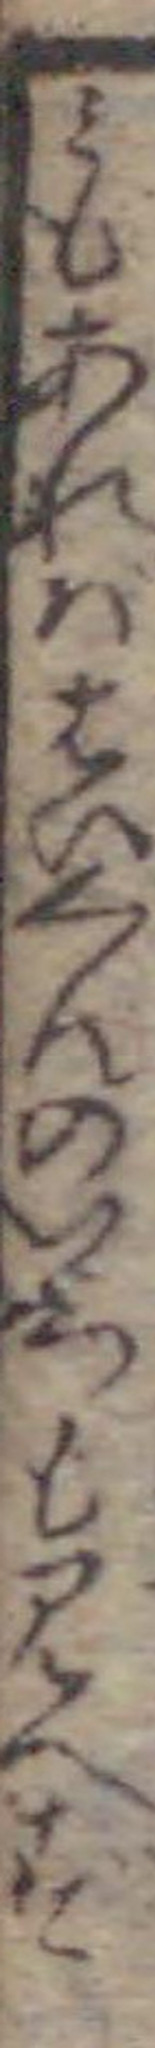みもあればいくんのいのちも見へず
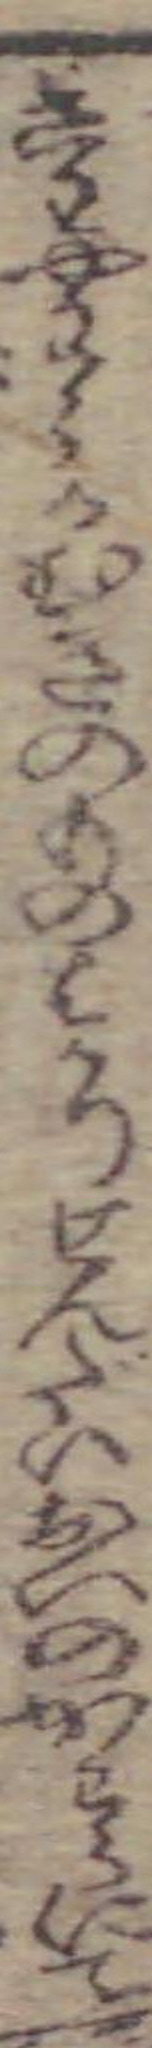きわやわらかむきのものはかりせんだいおいのかわうに
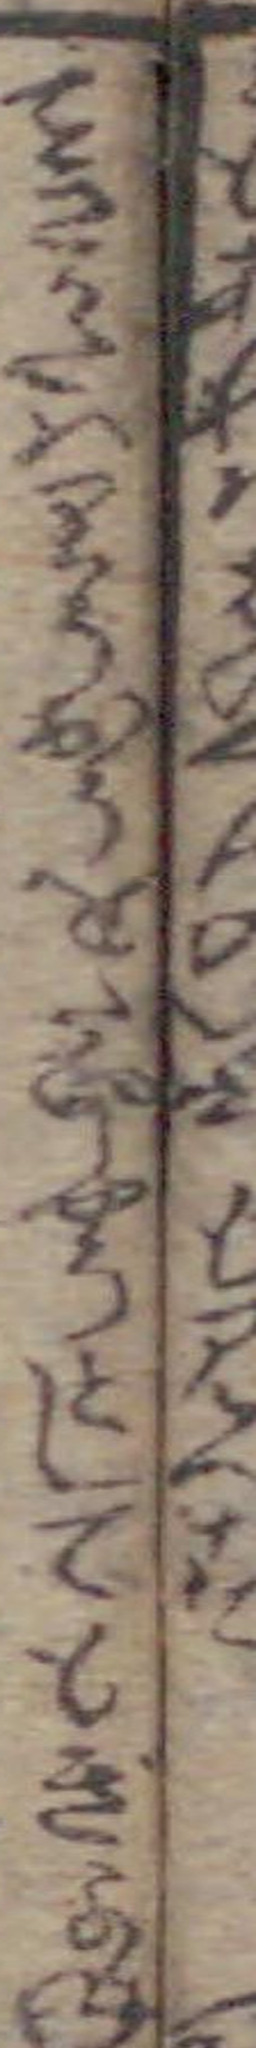てきかたはりうおうをたいしやうとしてもぎより
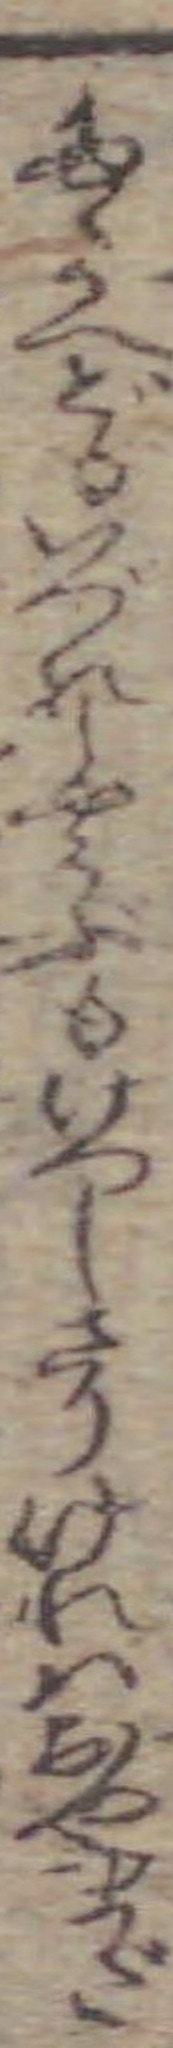たゝかへどもいづれしやうぶもけつしさりけれはおやまだ
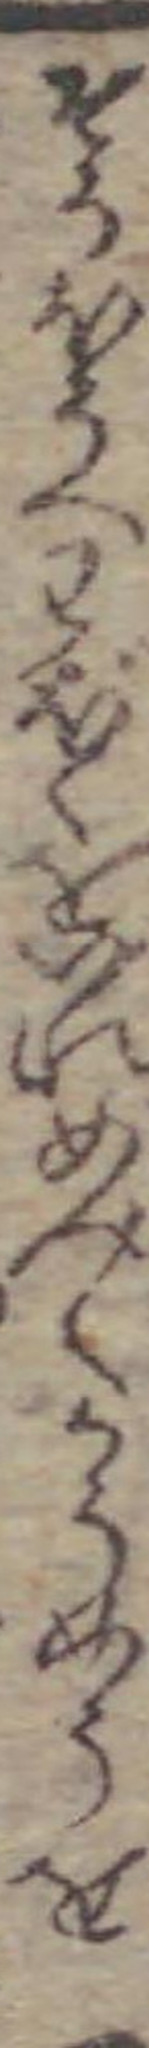そうほうへわぼくをいれめん〳〵かうめうを
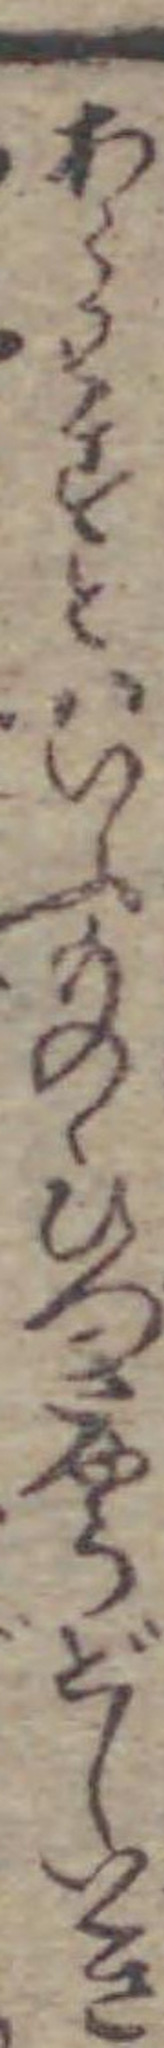あらわすとはいふものゝひつきやうどしいくさ
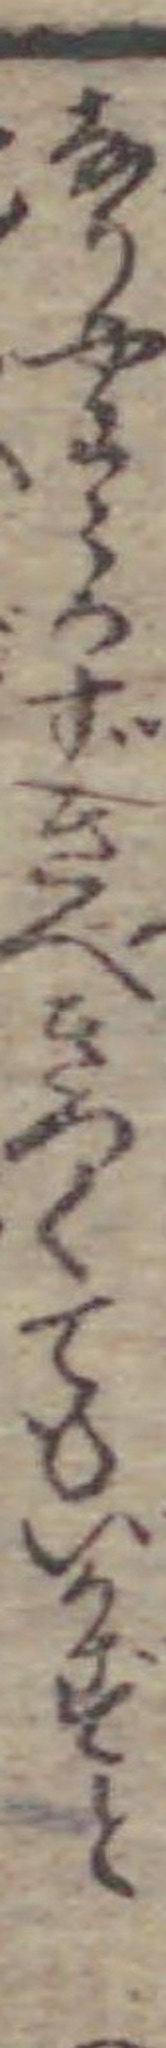なりやわらかずきべきつくてもいかずと
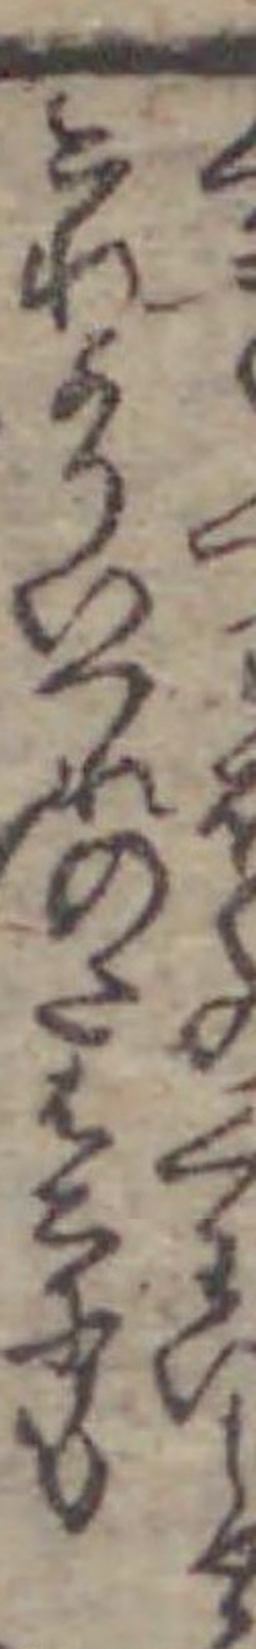これよりいつれのたはこにも
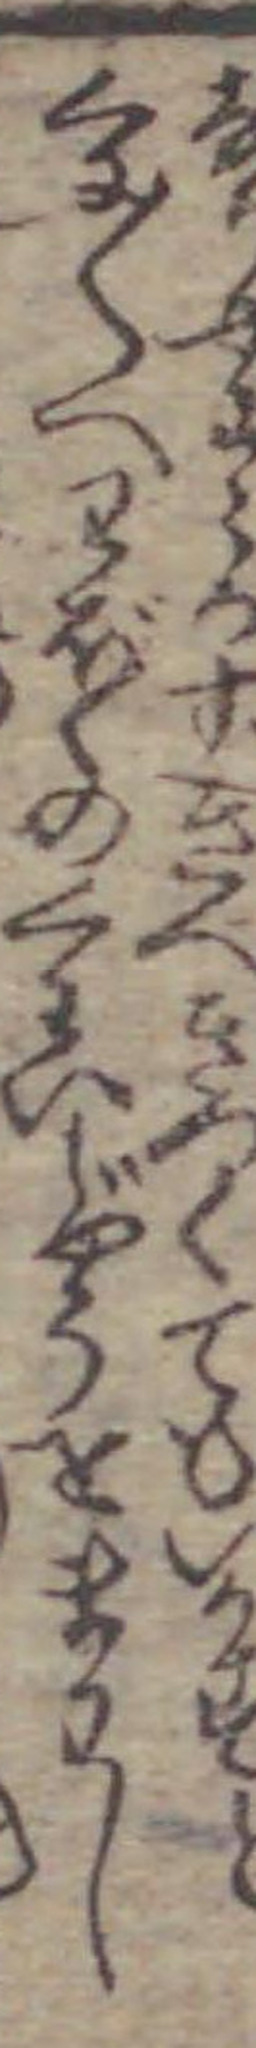くる〳〵へわぼくのくわいじやうをまわし
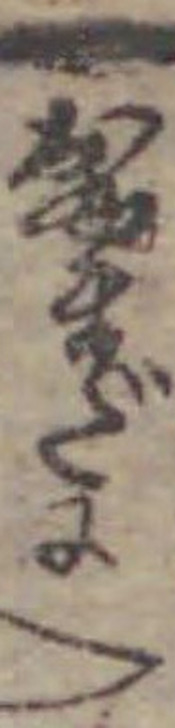おやまだに
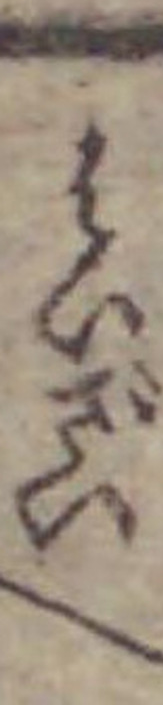はいざい
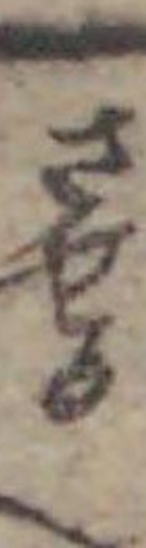させる

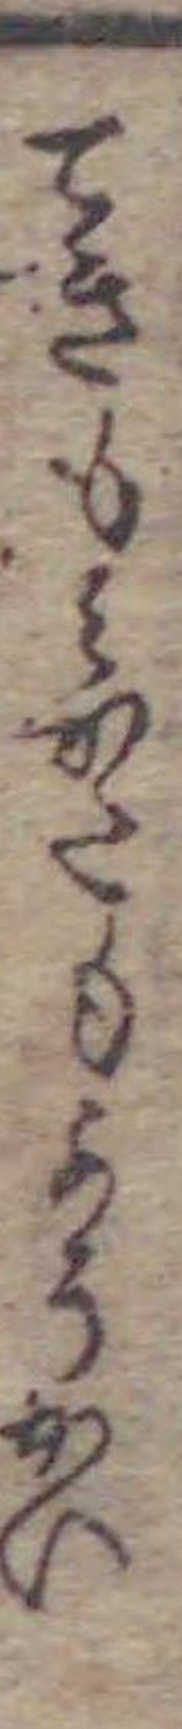てきもみかたもあろかい
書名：談芭菰誉詞 : 3巻
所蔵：国立国会図書館 National Diet Library, JAPAN
